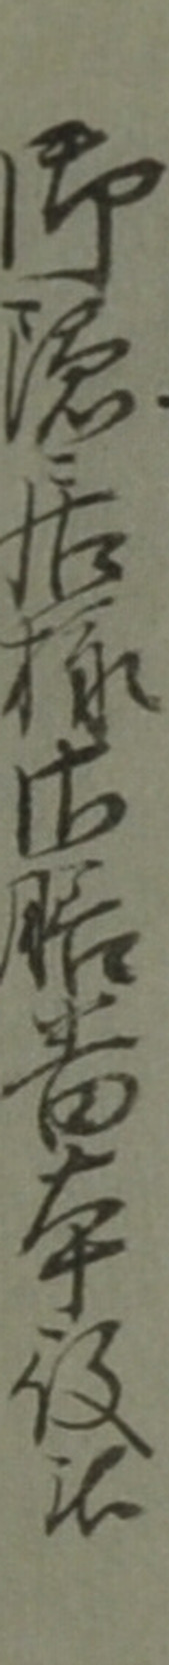御隠居様御膳番本役被
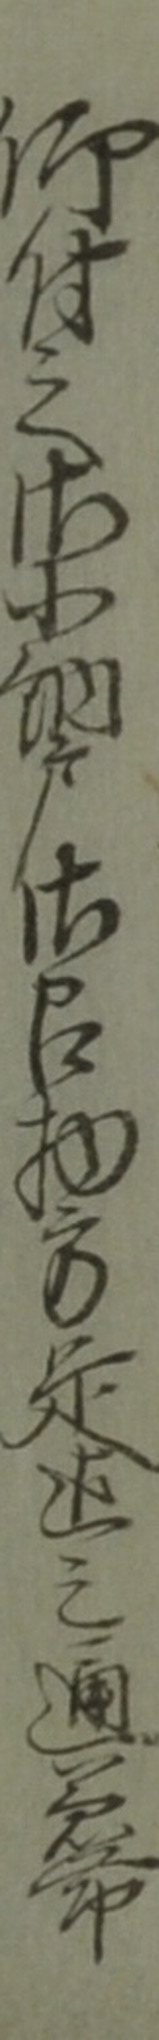仰付之御小納戸御召物方是迄之通兼帯
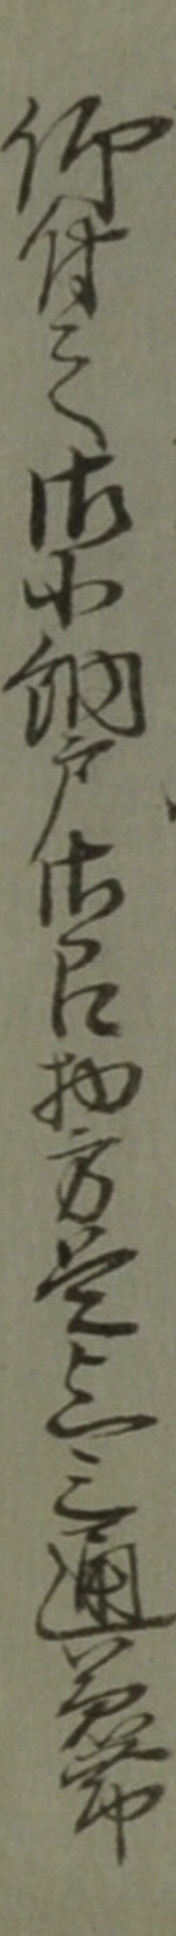仰付之御小納戸御召物方是迄之通兼帯
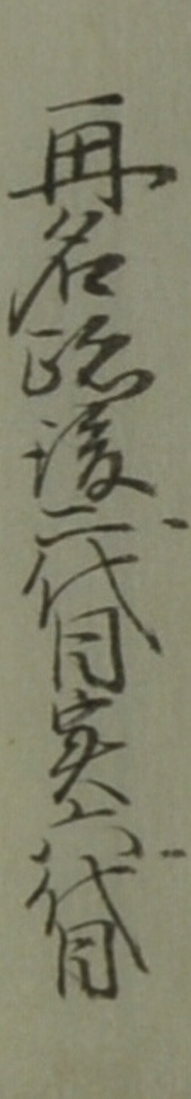再名跡後二代目実六代目

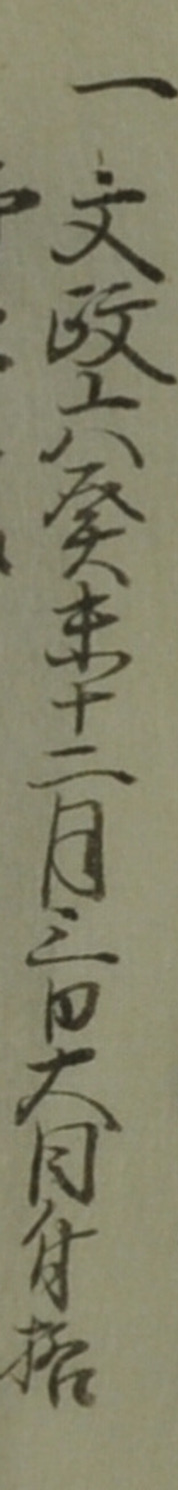一文政六癸未十二月三日大目付格
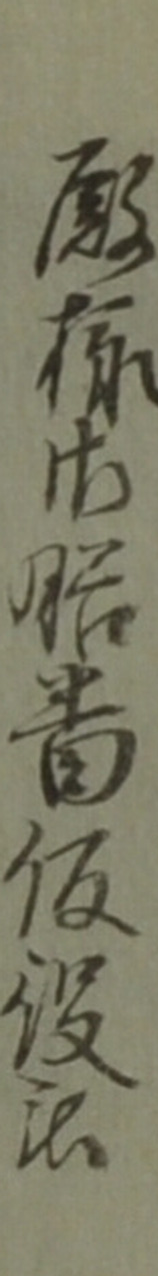御同所様御膳番仮役被
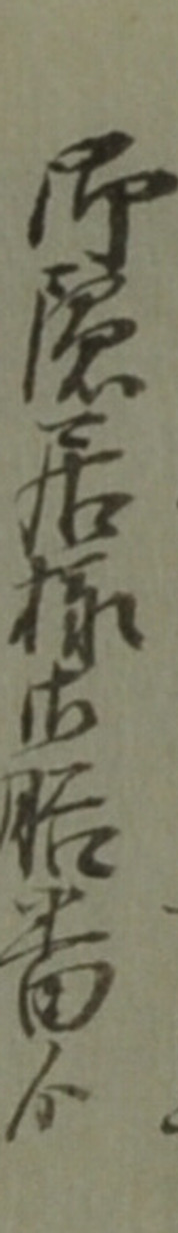御隠居様御膳番ゟ
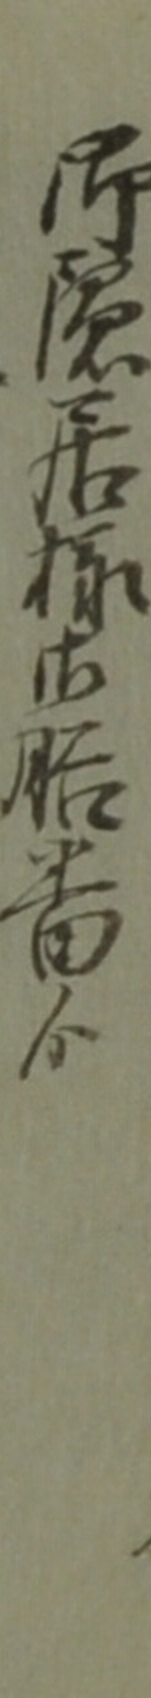御隠居様御膳番ゟ
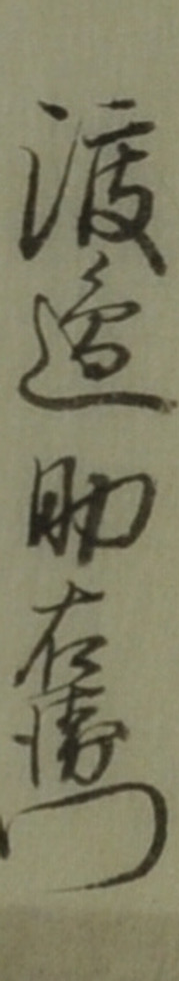渡辺助右衛門
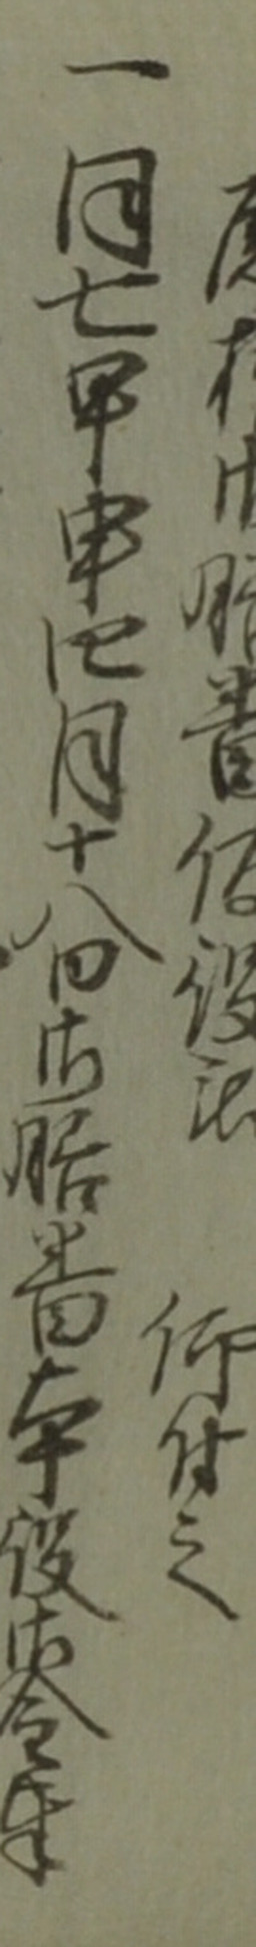一同七甲申四月十八日御膳番本役御金奉
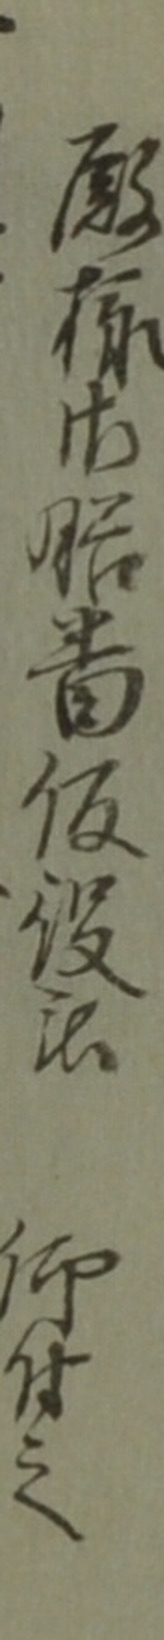殿様御膳番仮役被仰付之
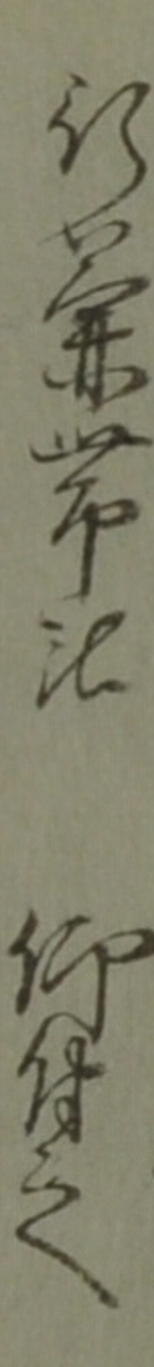行兼帯被仰付之
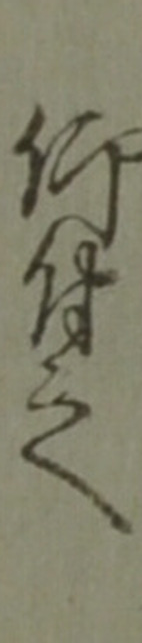仰付之
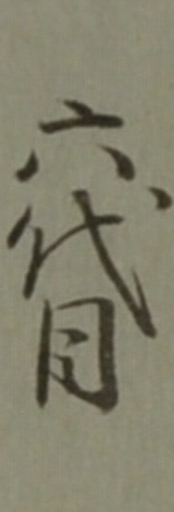六代目
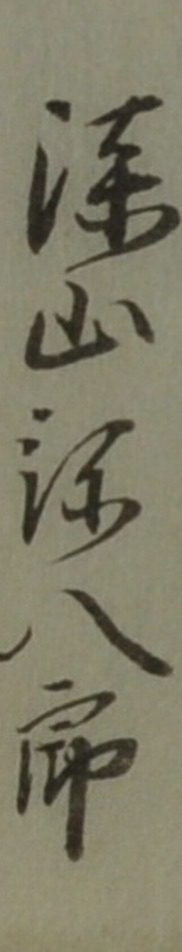漆山弥八郎
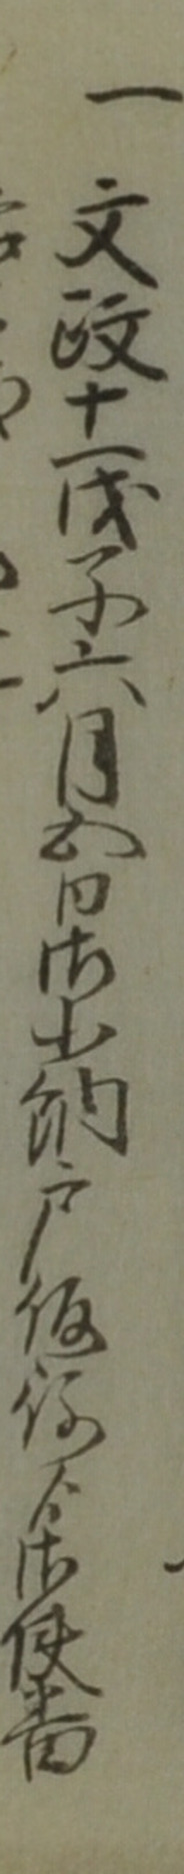一文政十一戊子六月五日御小納戸仮役ゟ御使番
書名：諸御役代々録（四）
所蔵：伊那市立高遠町図書館・合同会社AMANE
